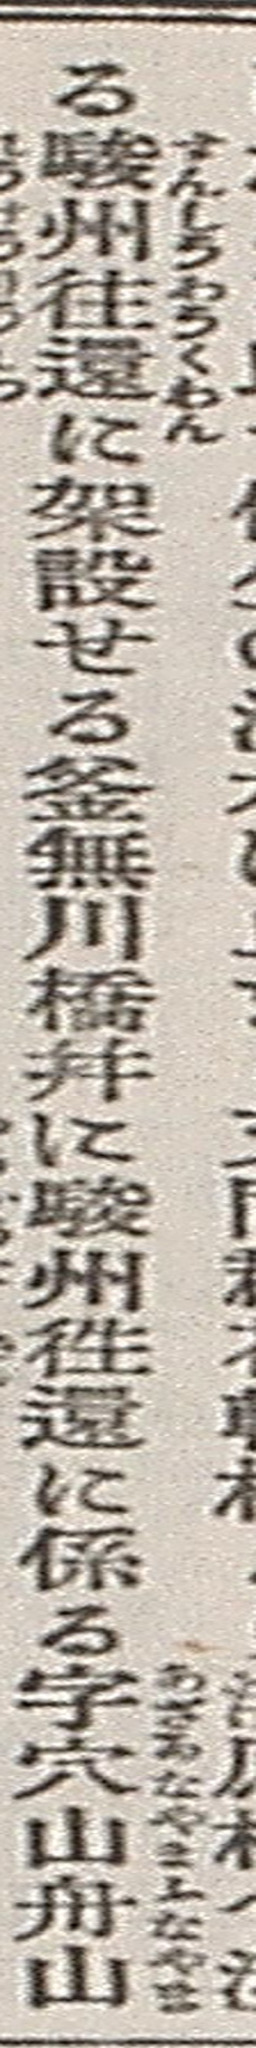る駿州往還に架設せる釜無川橋并に駿州往還に係る字穴山舟山
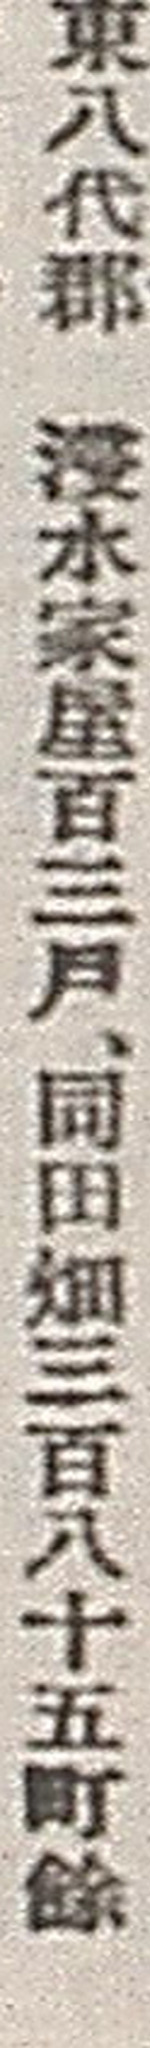東八代郡浸水家屋百三戸、同田畑三百八十五町餘
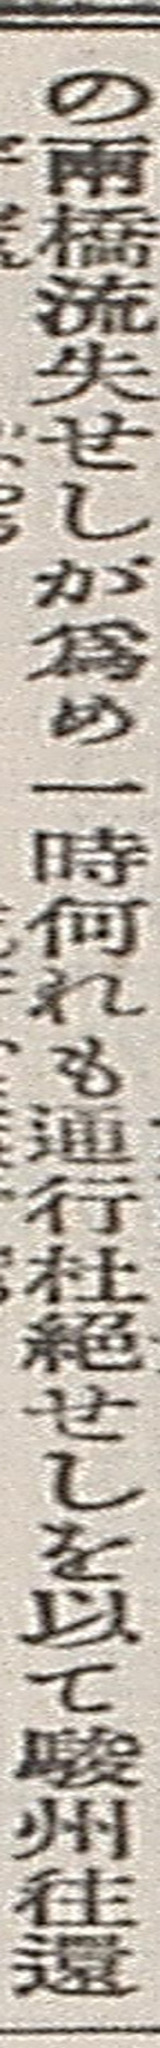の両橋流失せしが為め一時何れも通行杜絶せしを以て駿州往還
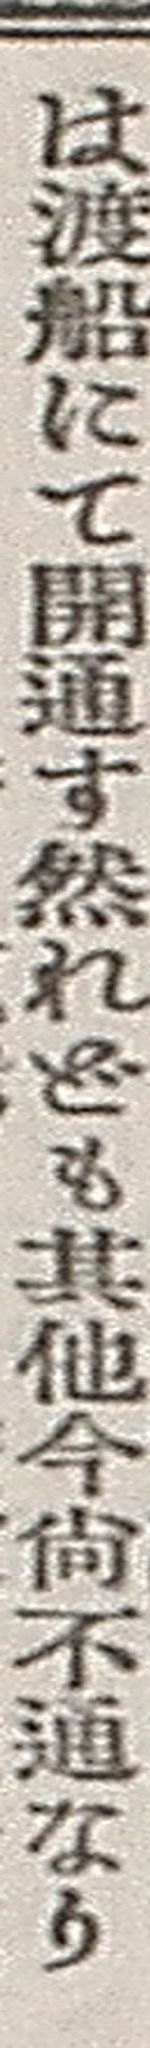は渡船にて開通す然れども其他今尚不通なり
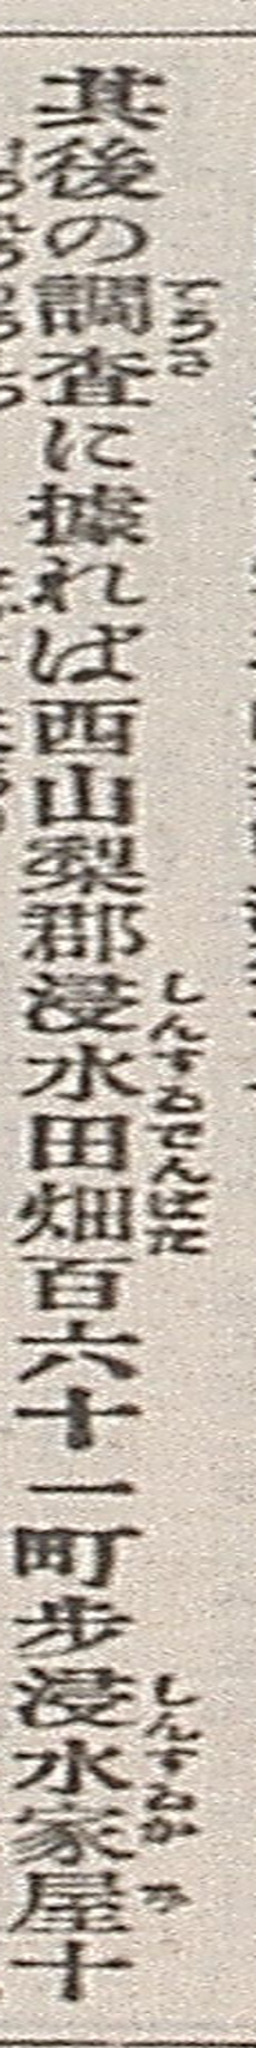其後の調査に據れば西山梨郡浸水田畑百六十一町歩浸水家屋十
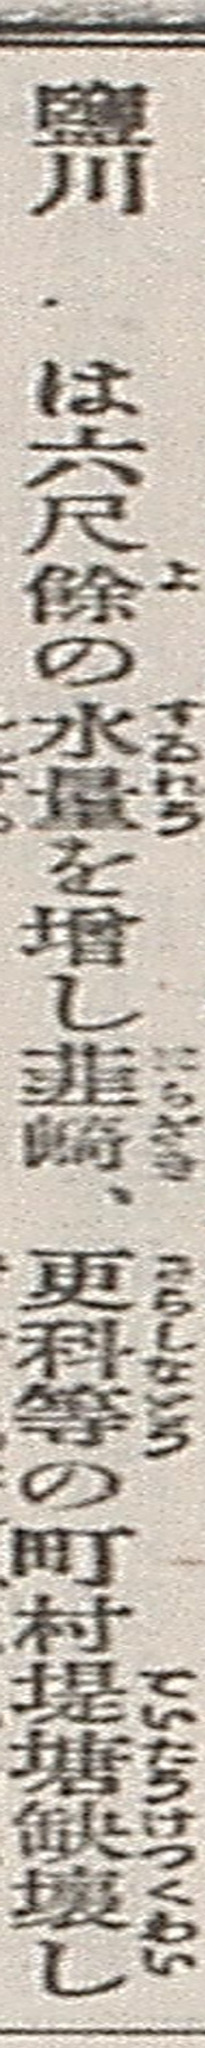鹽川は六尺餘の水量を増し韮崎、更科等の町村堤塘缺壊し
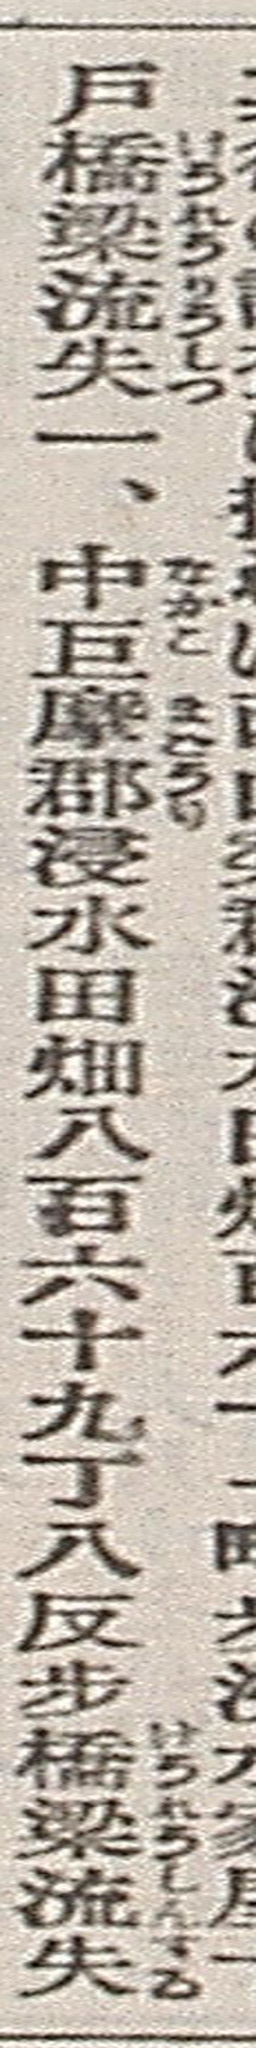戸橋梁流失一、中巨摩郡浸水田畑八百六十九丁八反歩橋梁流失
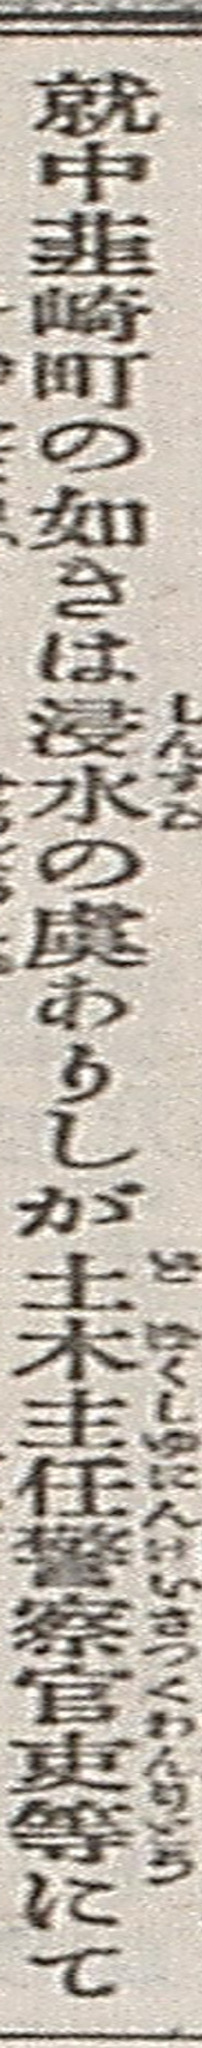就中韮崎町の如きは浸水の虞ありしが土木主任警察官吏等にて
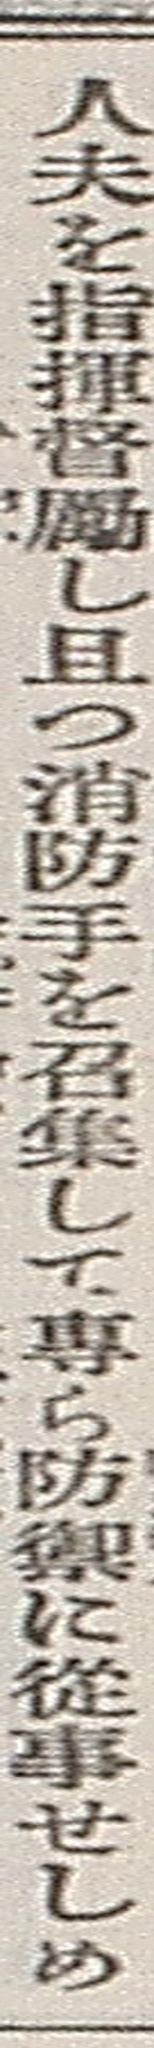人夫を指揮督励し且つ消防手を招集して専ら防禦に従事せしめ
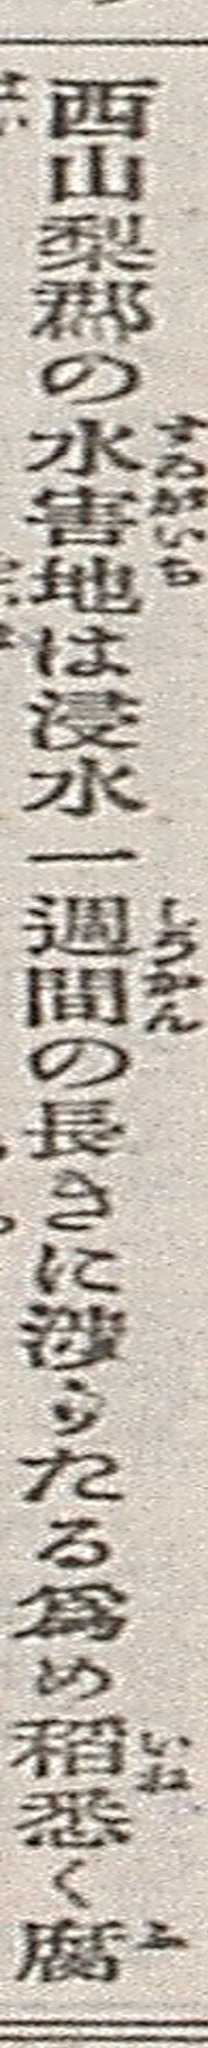西山梨郡の水害地は浸水一週間の長きに渉りたる為め稲悉く腐
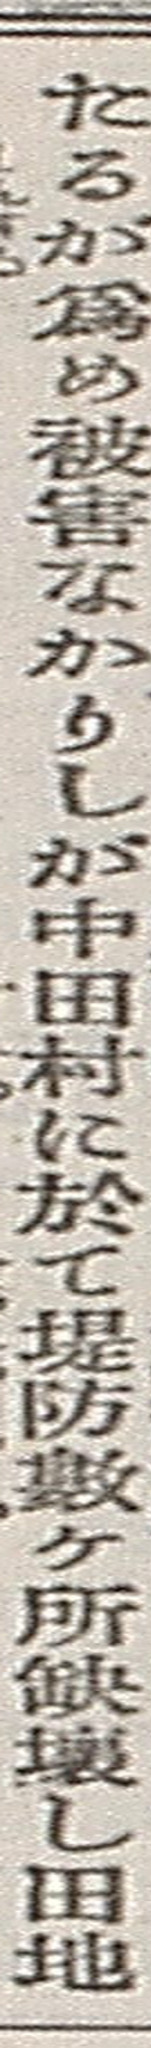たるが為め被害なかりしが中田村に於て堤防数ヶ所缺壊し田地
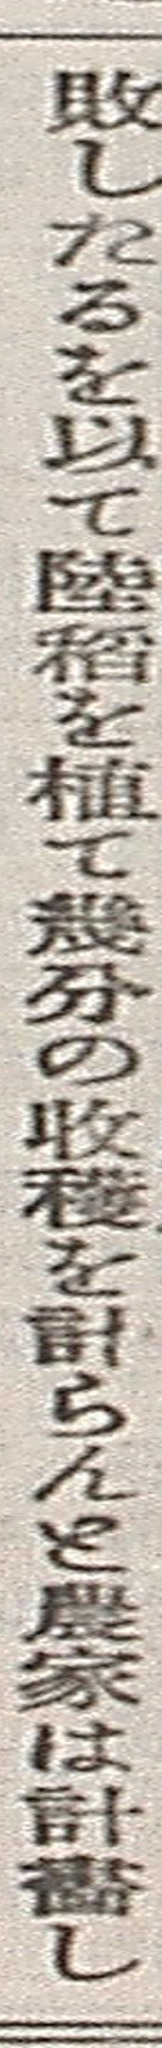敗したるを以て陸稲を植て幾分の収穫を計らんと農家は計畫し
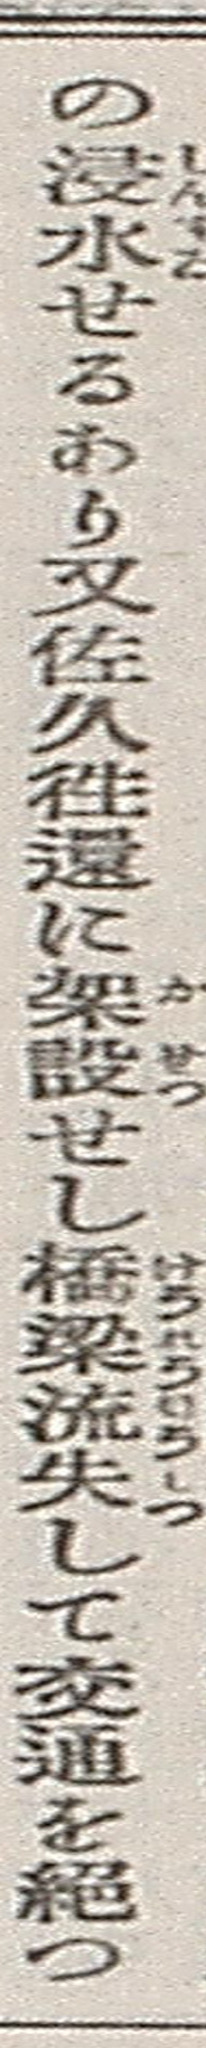の浸水せるあり又佐久往還に架設せし橋梁流失して交通を絶つ
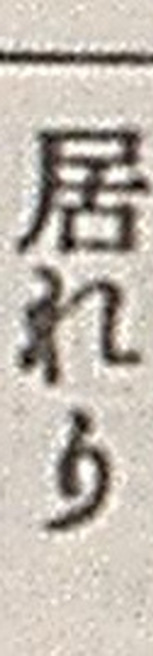居れり
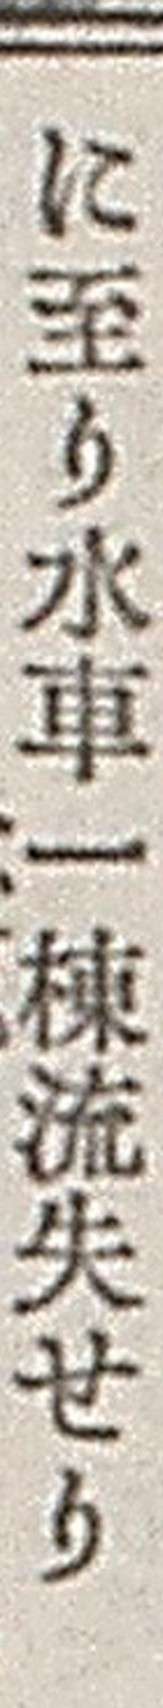に至り水車一棟流失せり
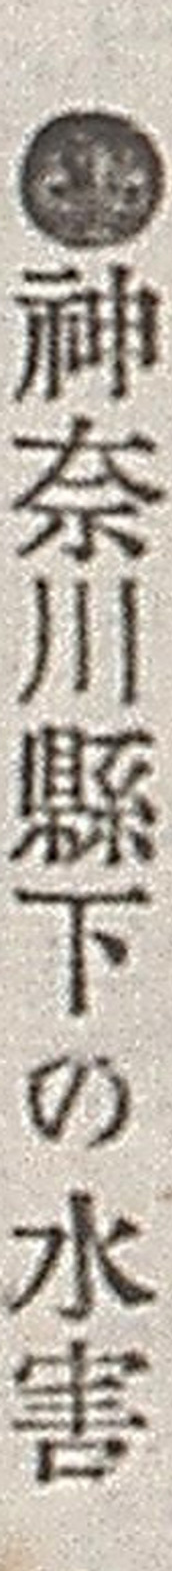●神奈川県下の水害
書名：風俗畫報臨時増刊第百二十八號　洪水被害録（下）
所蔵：東京大学地震研究所図書室 Earthquake Research Institute Library, The University of Tokyo, JAPAN
